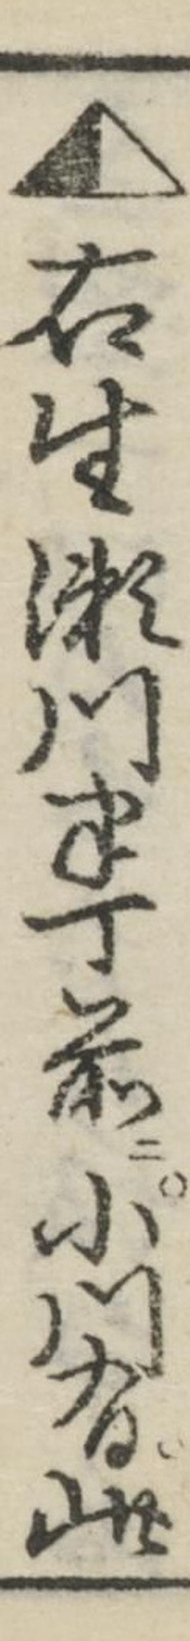▲右生瀬川半丁前に。小川有此
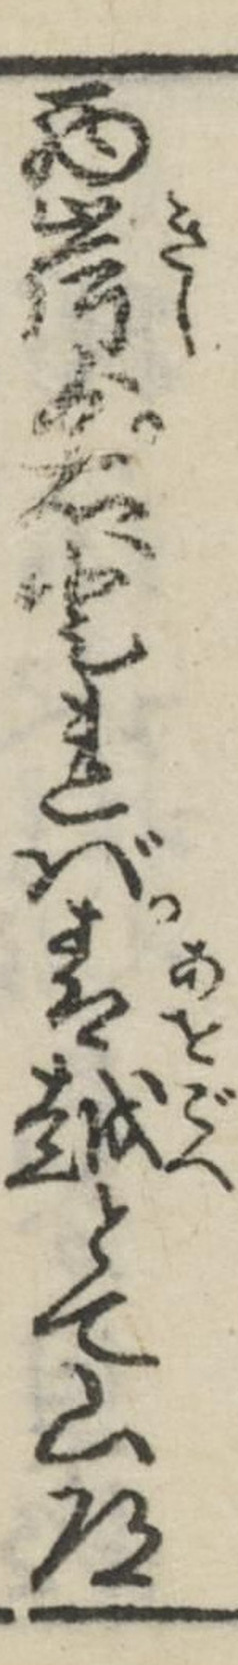西岸ゟ右へ登れば。青越とて山道
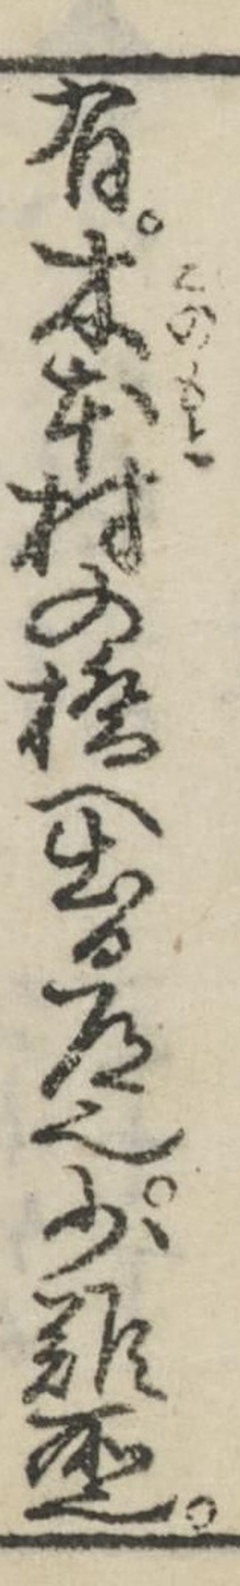有。木本村の橋へ出る道也。少難所也。
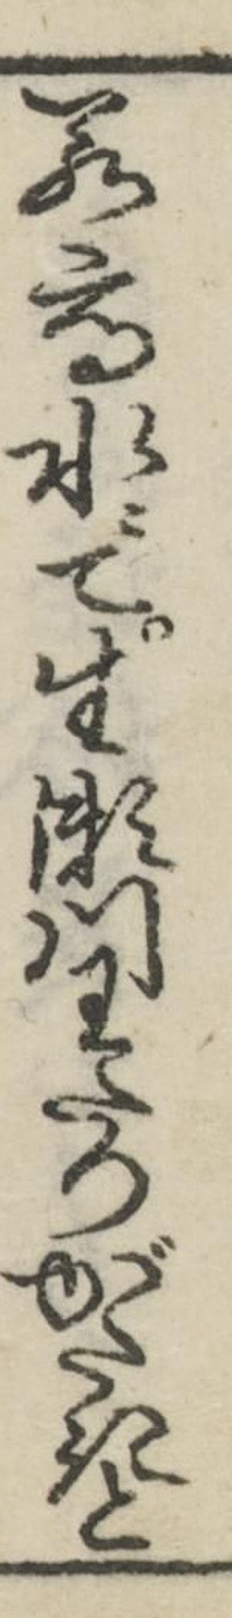若高水にて。生瀬川わたりがたきと
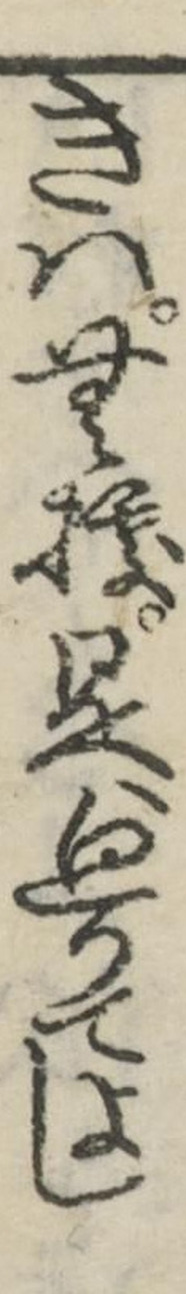きは。無拠。是へ廻りてよし

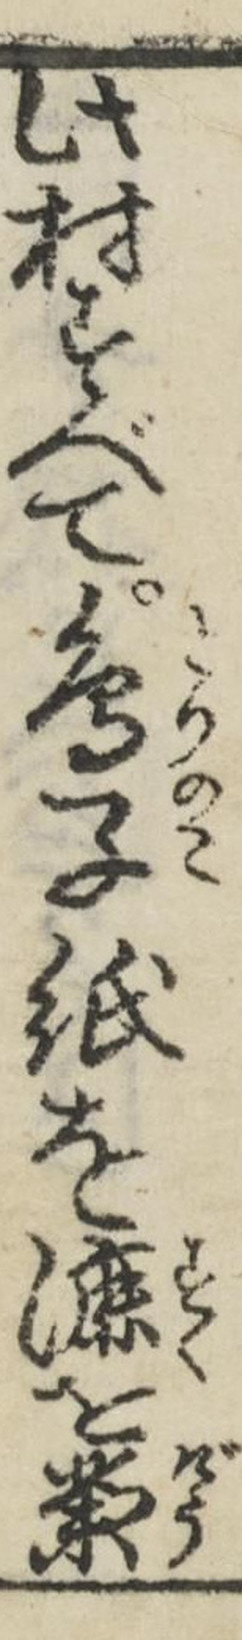此村すべて。鳥子紙を漉を業
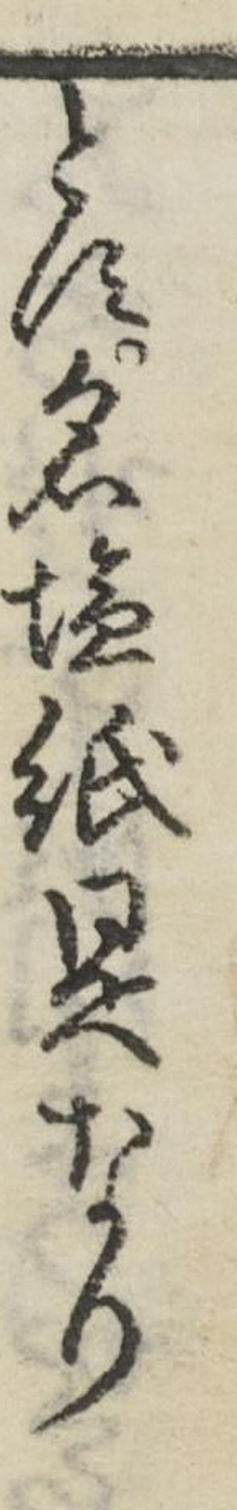とす。名塩紙是なり
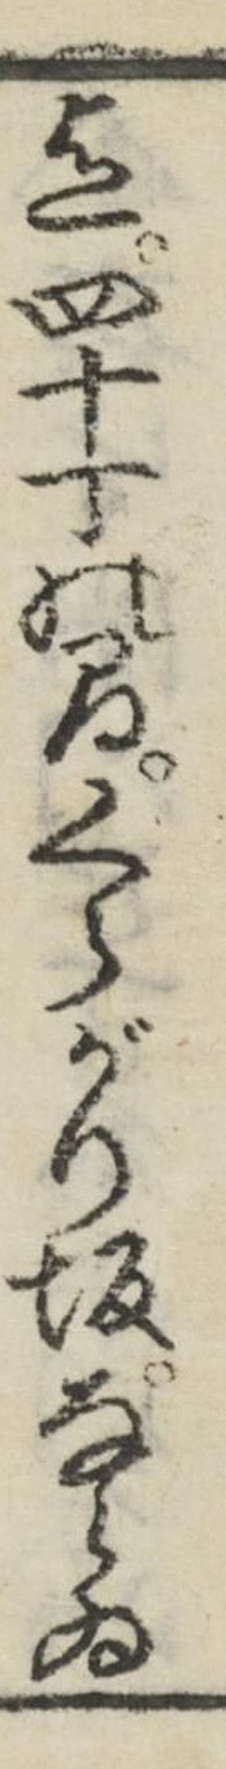迄四十丁の間。くらがり坂ならゐ
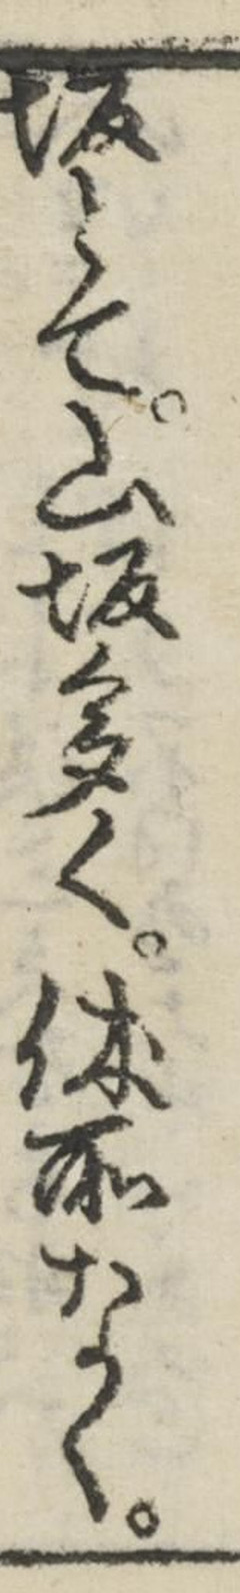坂とて。山坂多く。休所なく。
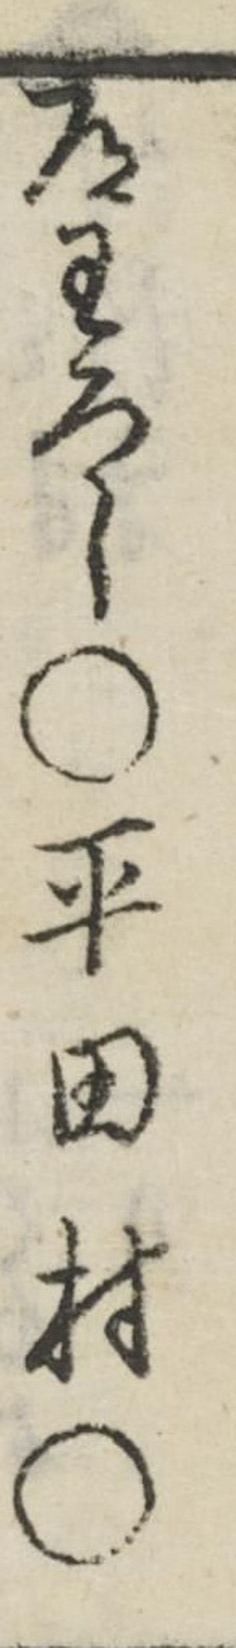道わろし○平田村○
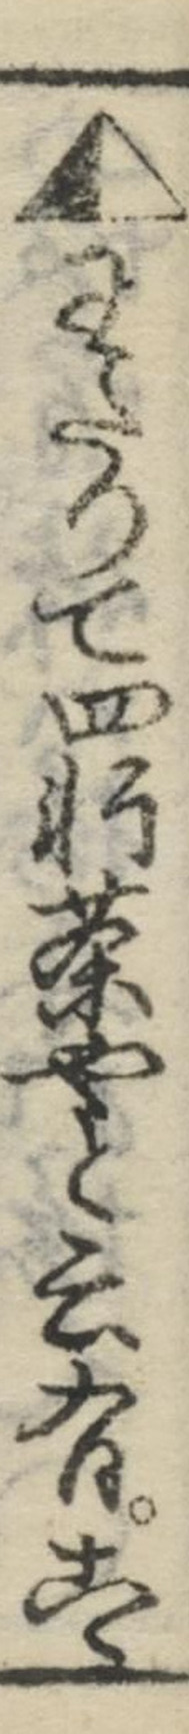▲わたりて四軒茶やと云有。ここ
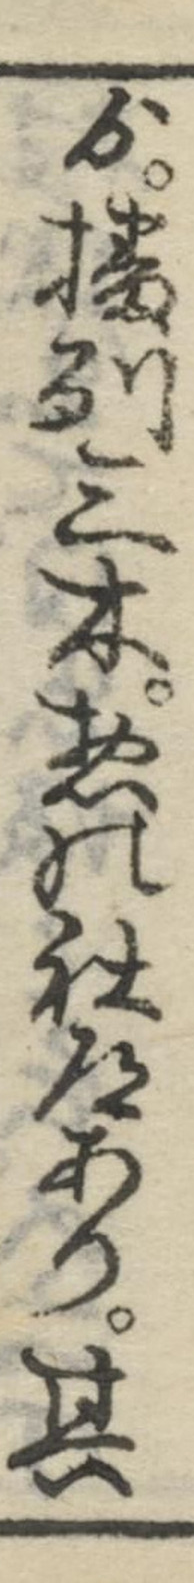ゟ。播州三木。惣の社道あり。其
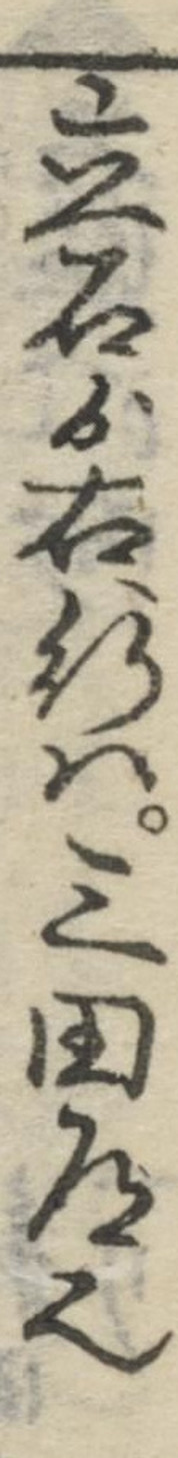立石ゟ右へ行は。三田道也
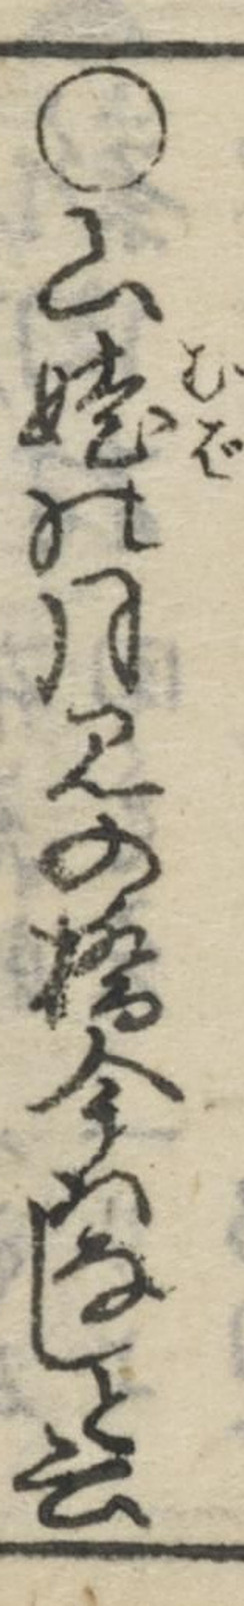○山姥の月見の橋今はなしと云
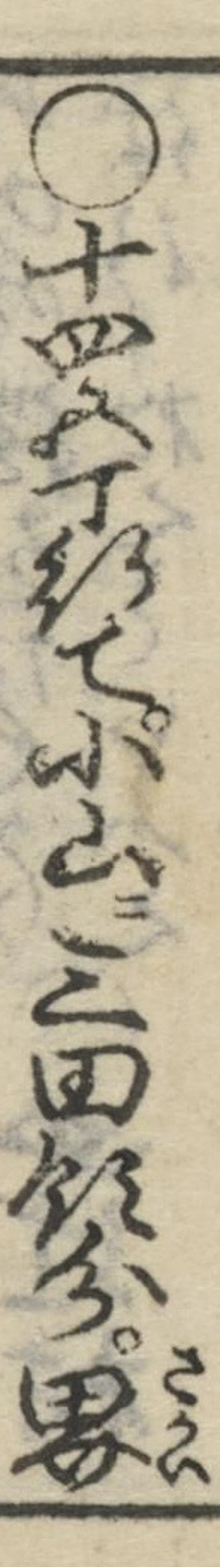○十四五丁行て。小山に三田領分。界
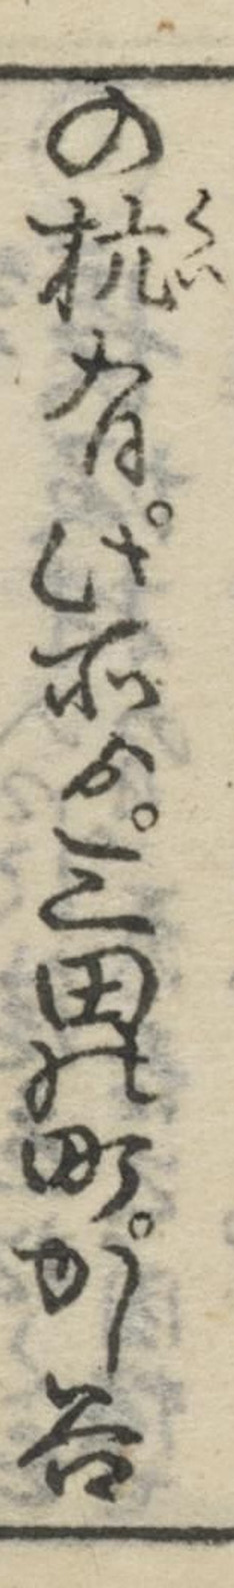の杭有。此所ゟ。三田の町。かし谷
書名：但州城崎浴湯辧
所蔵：東京大学地震研究所図書室 Earthquake Research Institute Library, The University of Tokyo, JAPAN
